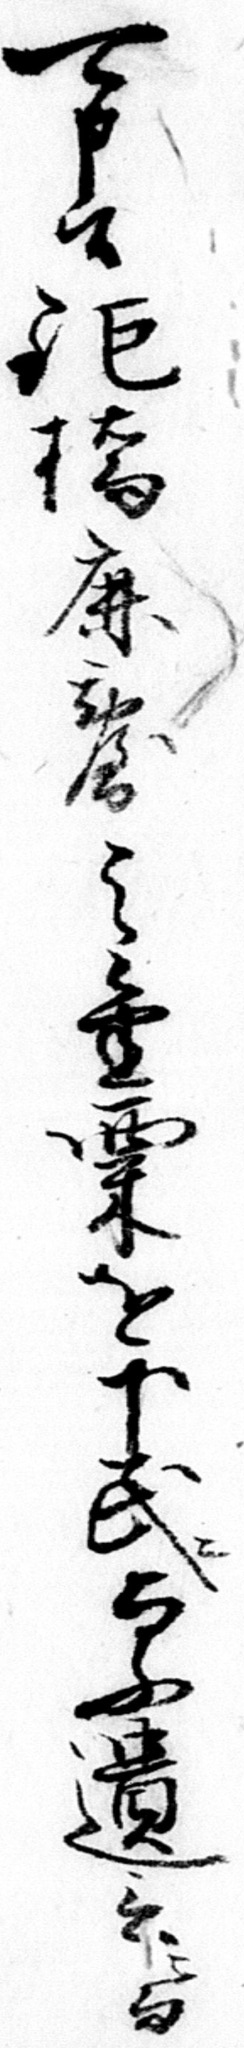可申候鉅橋鹿台之金粟を下民に与ふ遺言に而
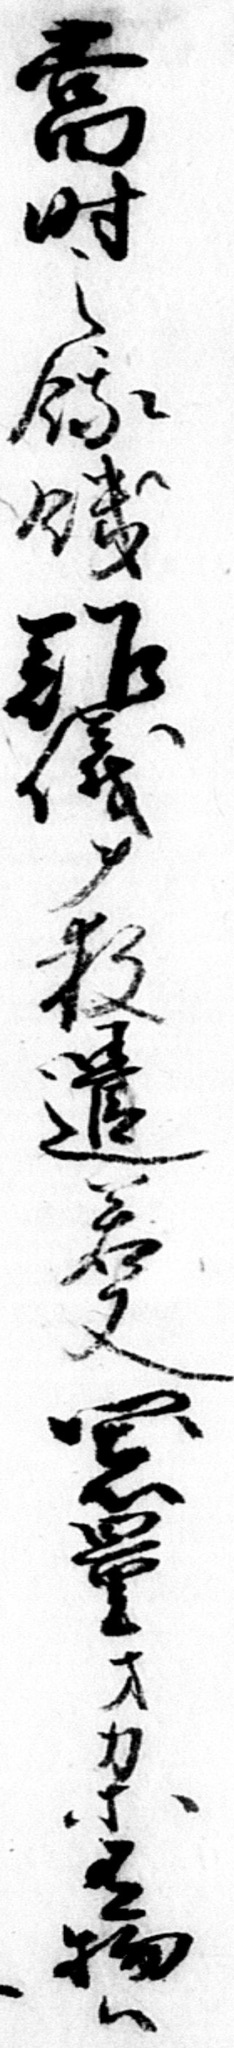当時之餓饑難儀を救遣若又器量才力等有物は
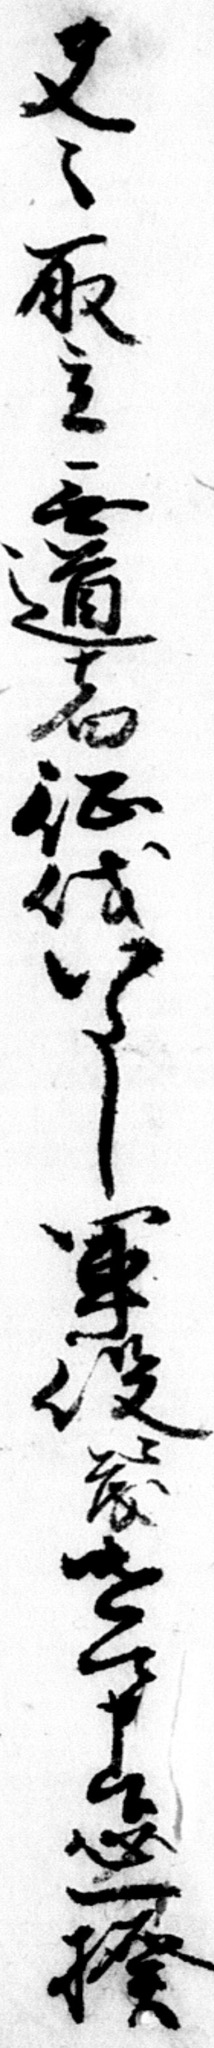又々取立無道者征伐いたし軍役にも遣可申候必一揆

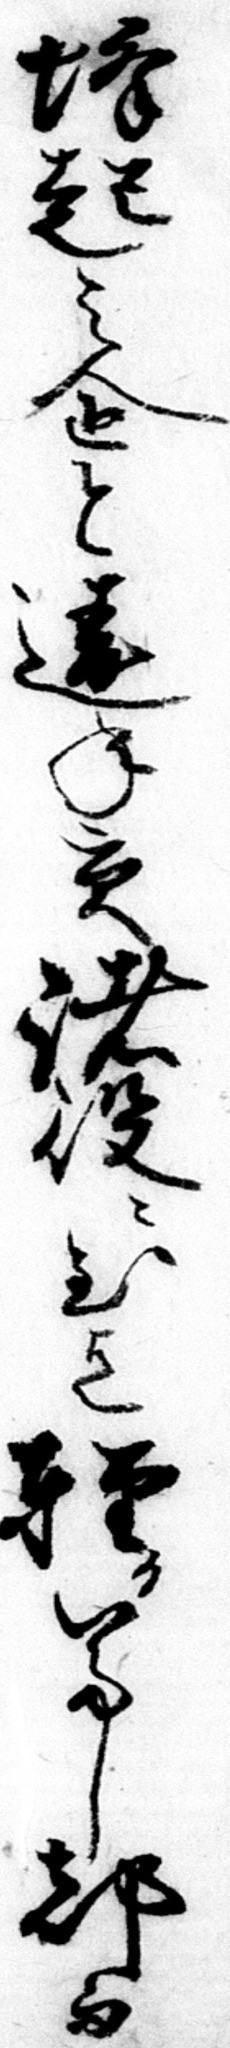蜂起之企と違年貢諸役に至迄軽くいたし都而
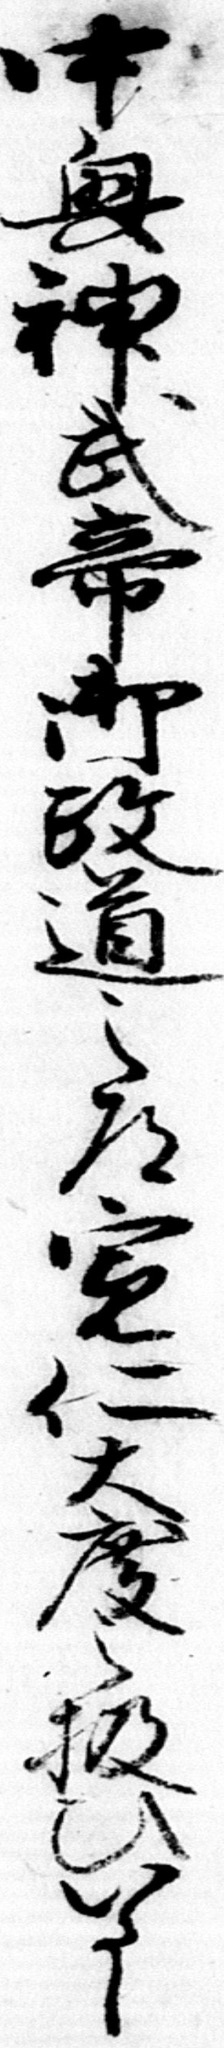中興神武帝御政道之道寛仁大慶之扱ひいたし
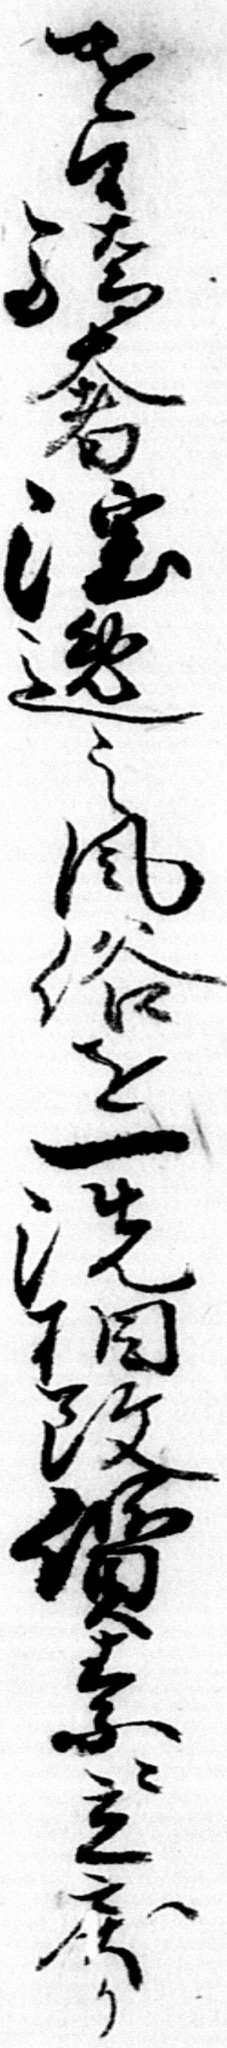遣候驕奢淫逸之風俗を一洗相改質素に立戻り
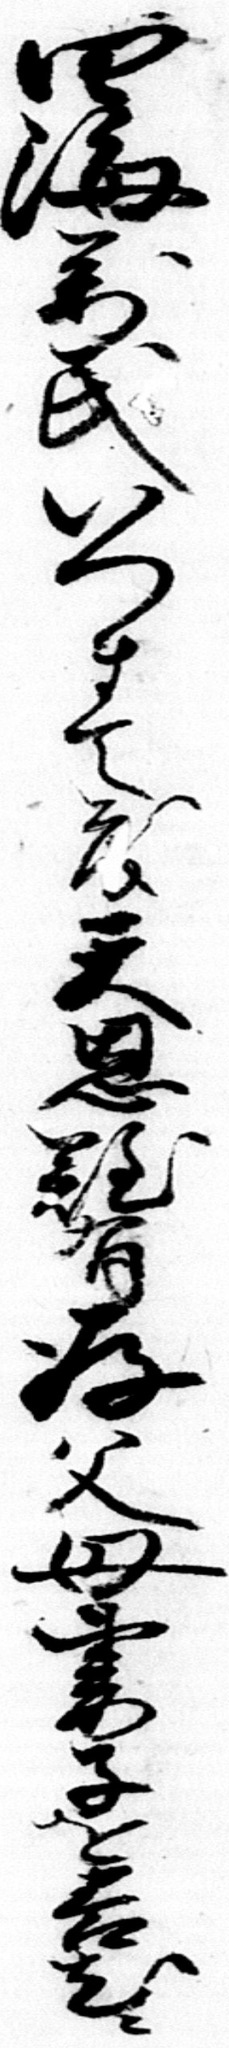四海万民いつまても天恩難有存父母妻子を養老に
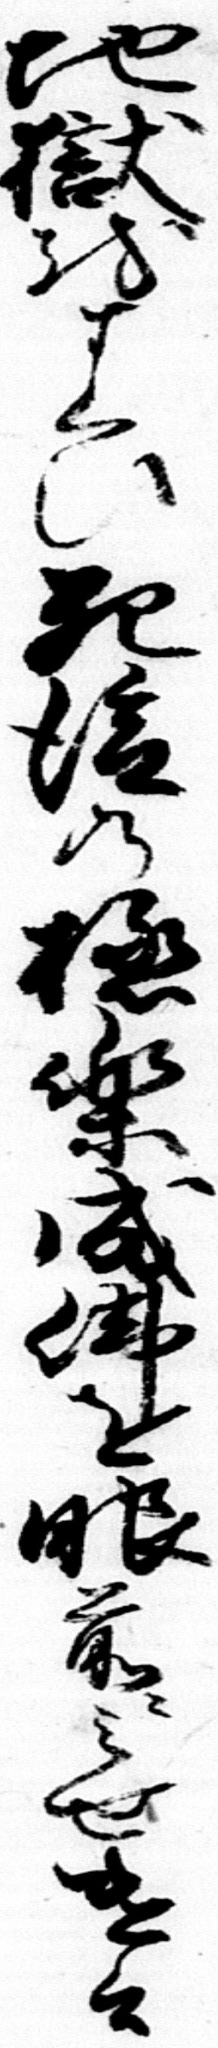地獄をすくひ死後の極楽成仏を眼前にみせ遣候
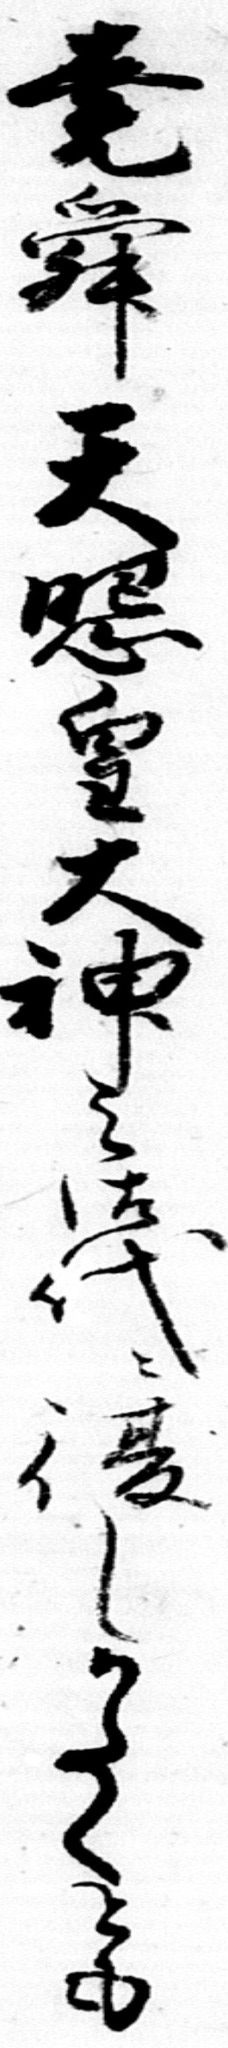堯舜天照皇大神之御代に復しかたくとも
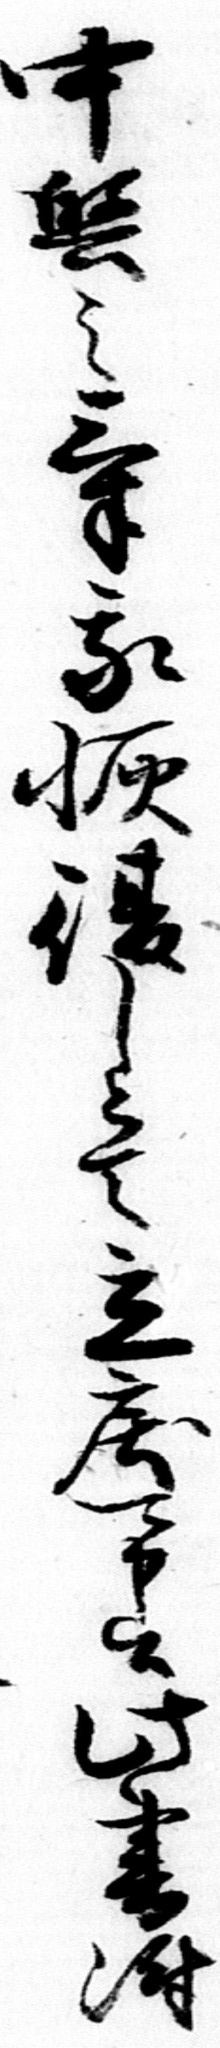中興之気我恢復しとて立戻可申候此書附
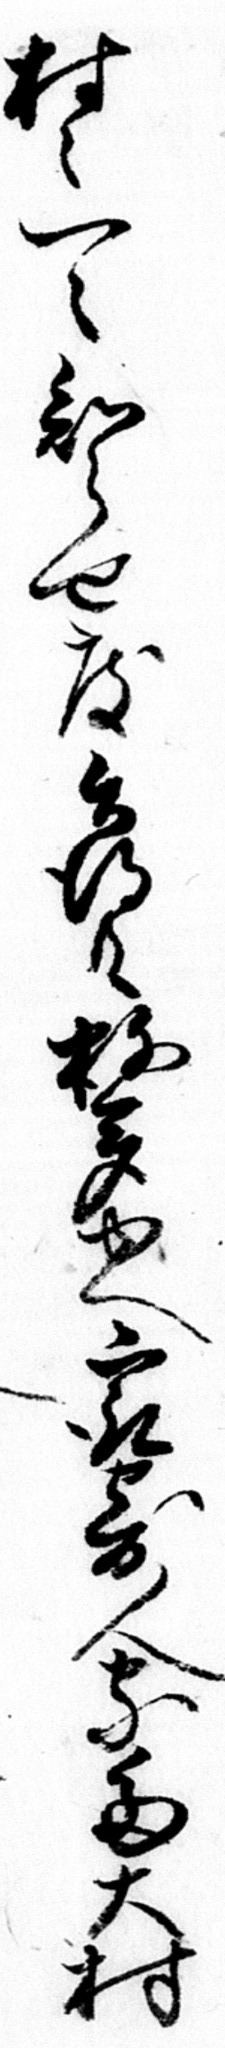村々一々知らせ度候得共数多ゆへ最寄人家多大村
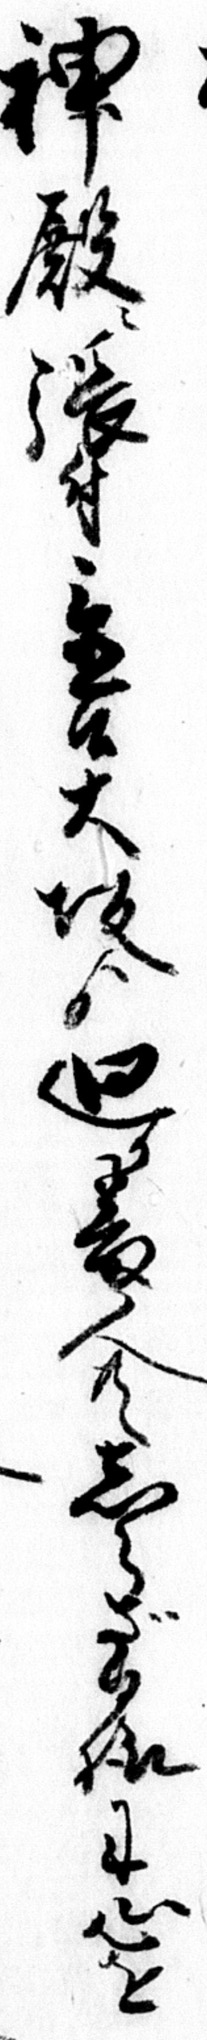神殿に張付置候大坂ゟ廻り番人共知らざる様に心を
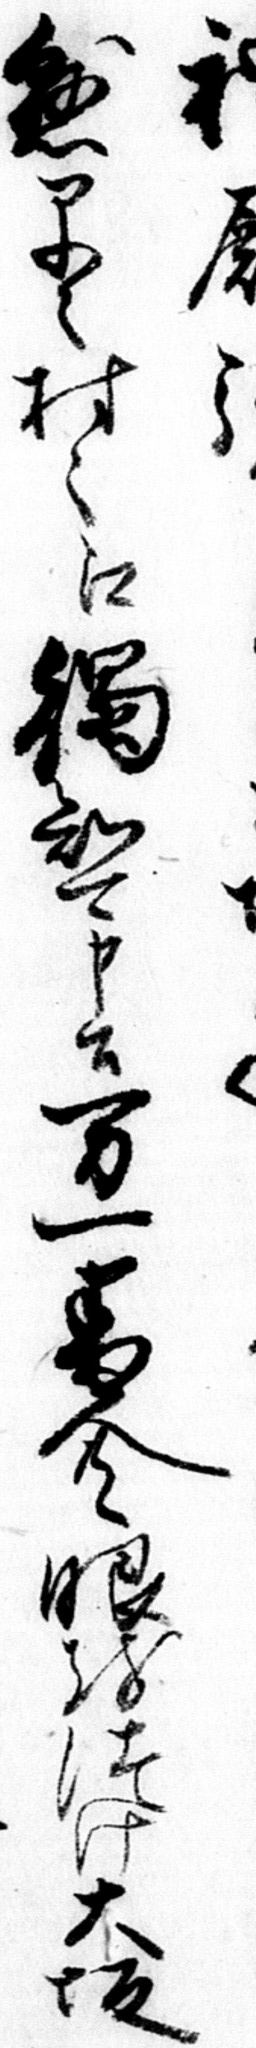懸早々村々え触知可申候万一番人共眼をつけ大坂
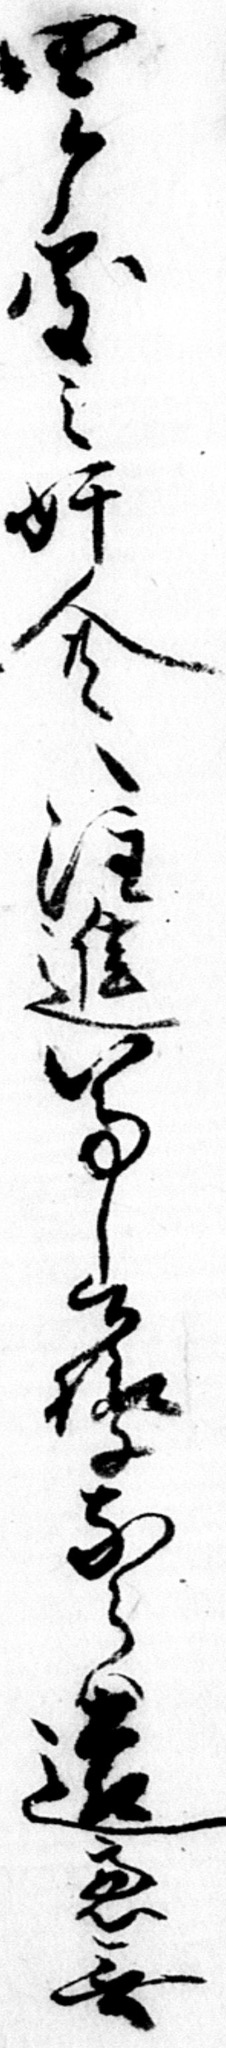四ヶ処之奸人共へ注進いたし候様子ならは遠慮無
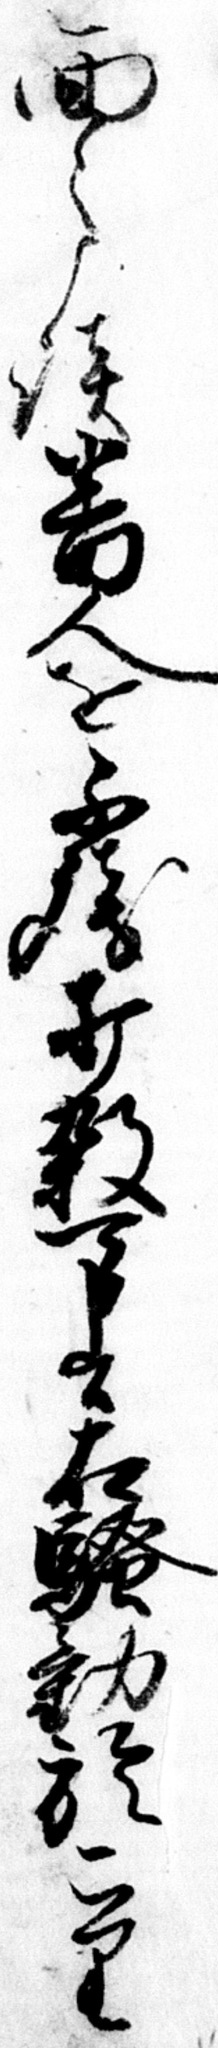面々申談番人を不残打殺可申候右騒動おこり

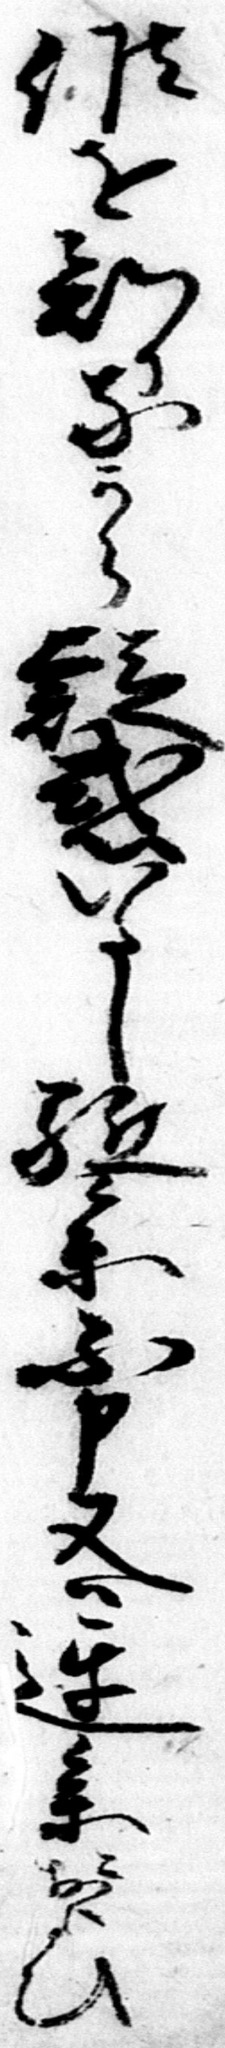候を知りなから疑惑いたし駈参不申又遅参におよひ
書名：大坂一件大塩平八郎存書
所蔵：徳島県立図書館
